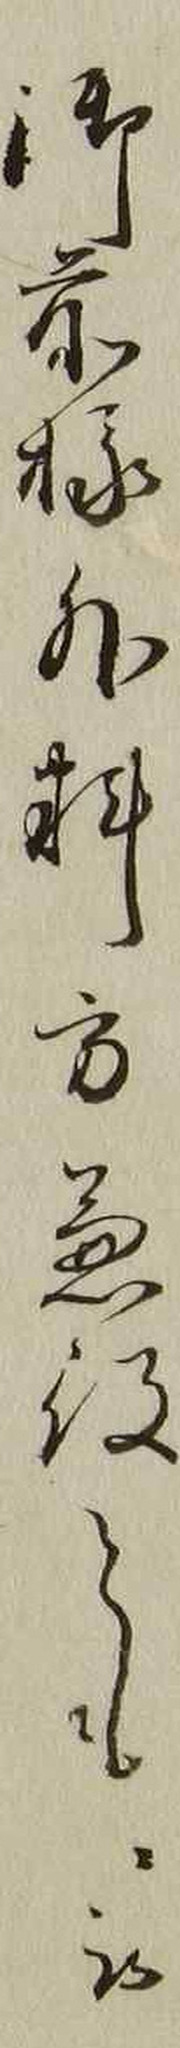御前様外料方兼役ともニ被
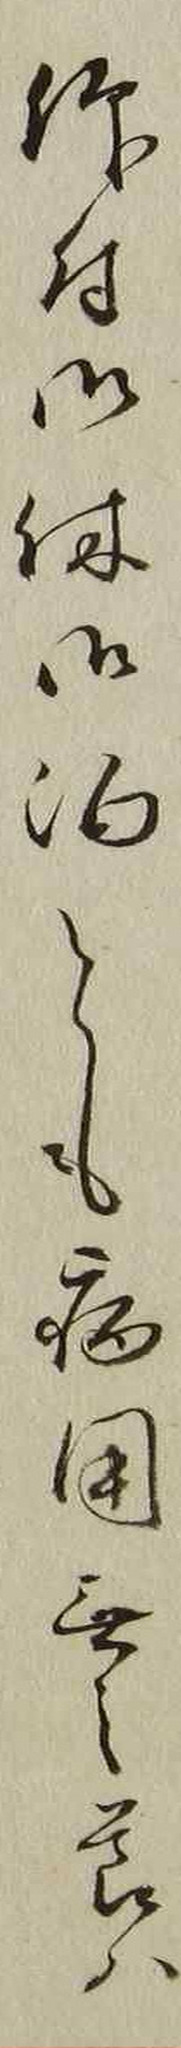仰付御休御泊とも病用無之節ハ
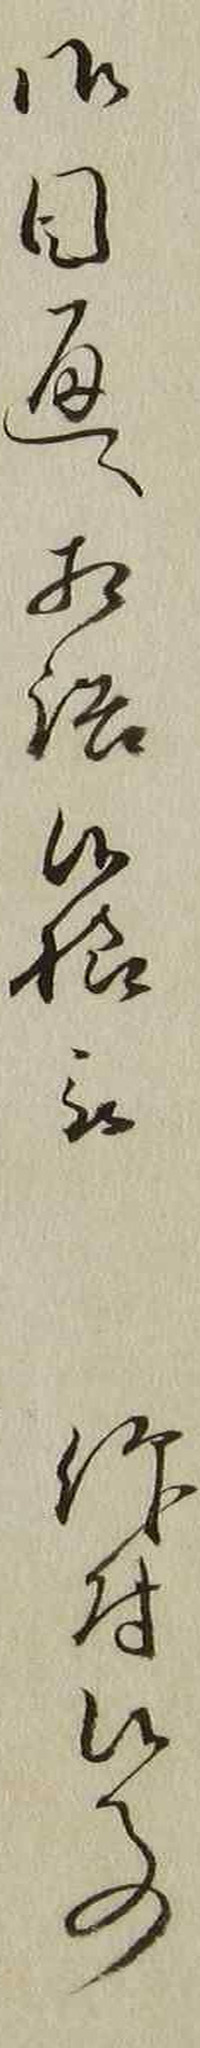御目通へ相詰候様被仰付候事
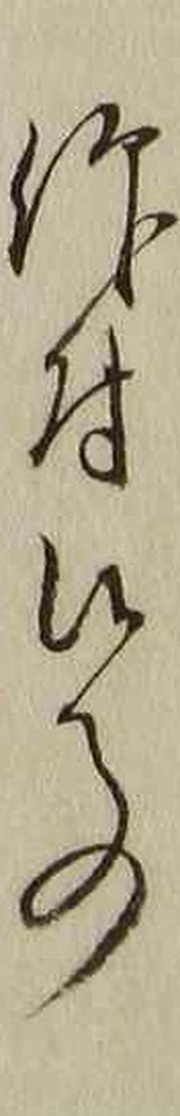仰付候事
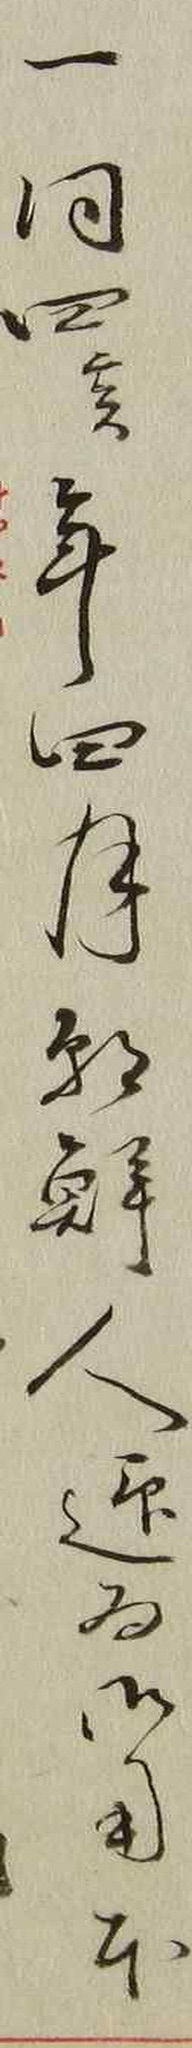一同四亥年四月朝鮮人迎為御用本
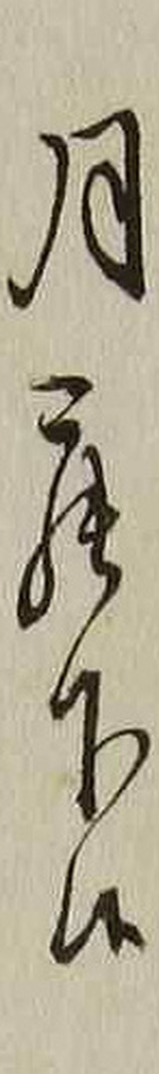月罷下候
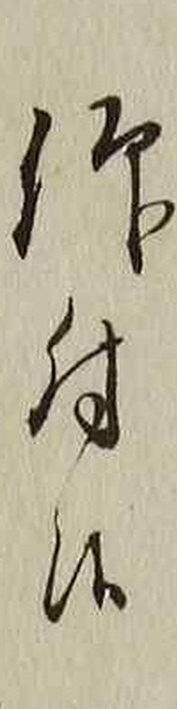仰付候
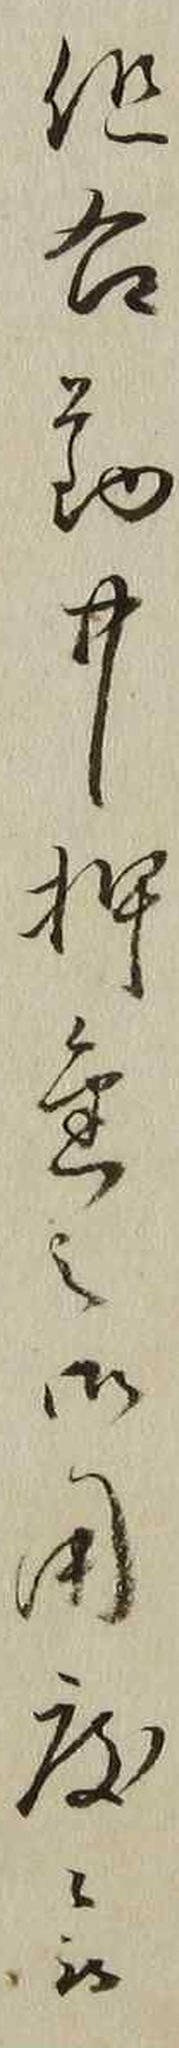但右勤中押金之御用度々被
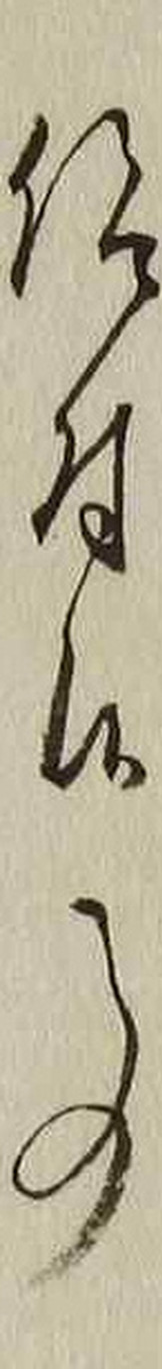仰付候事
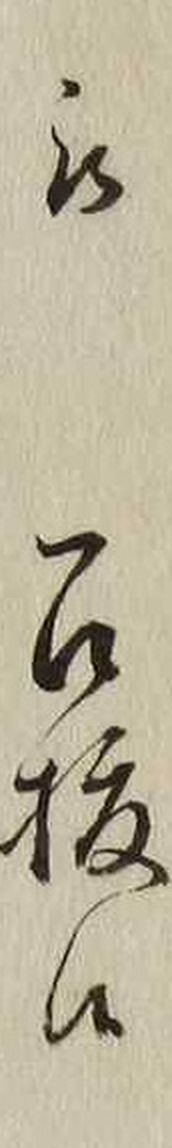被召抜候
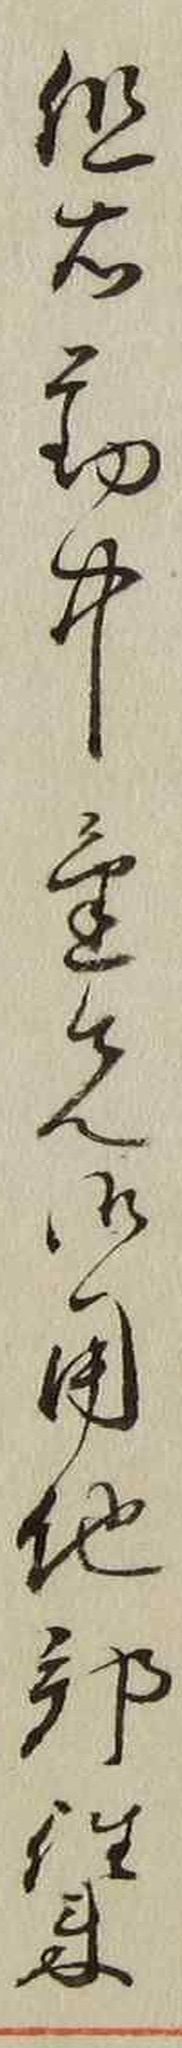但右勤中金先御用他邦往来
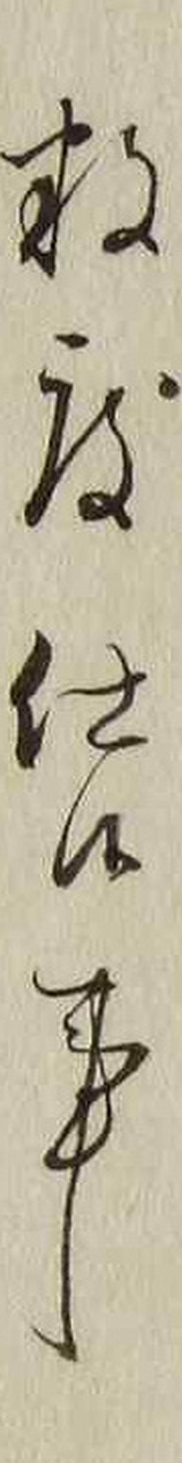数度仕候事
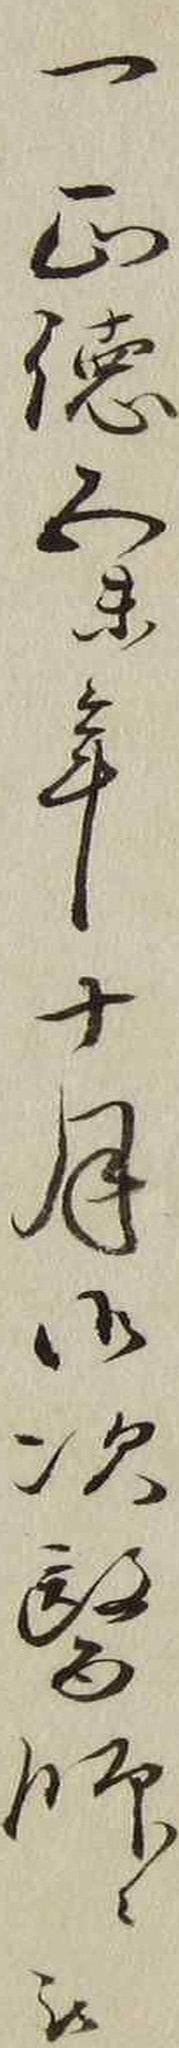一正徳五未年十月御次医師ニ被
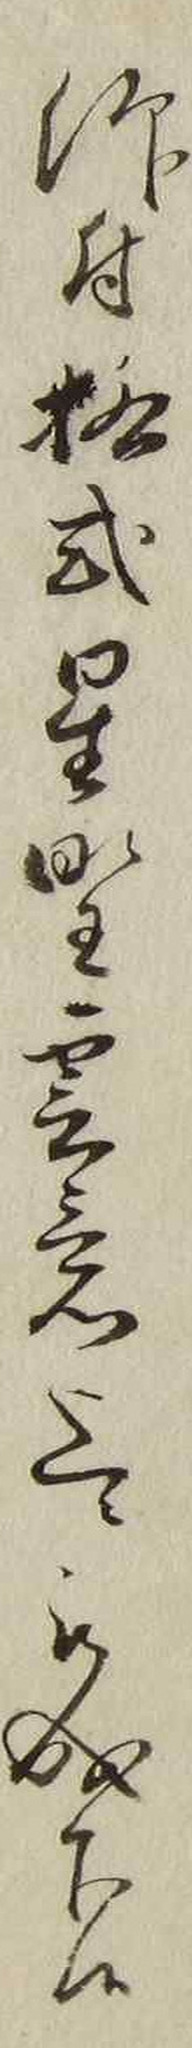仰付格式星野雲意上ニ被成下候
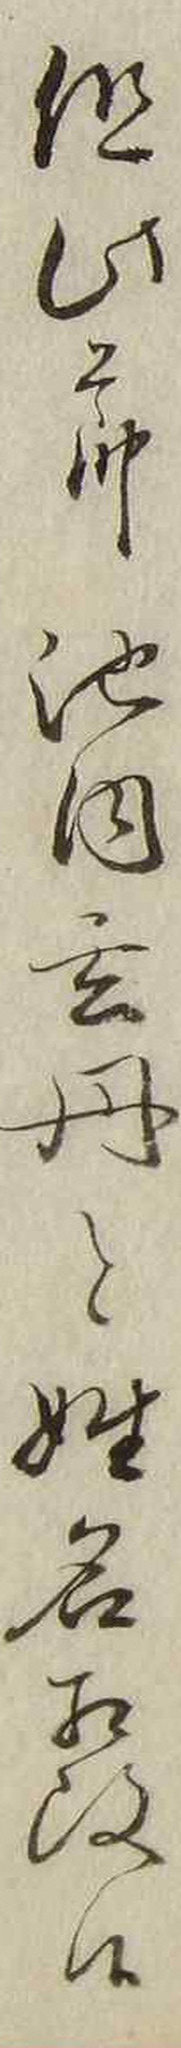但此節池内玄丹と姓名相改候

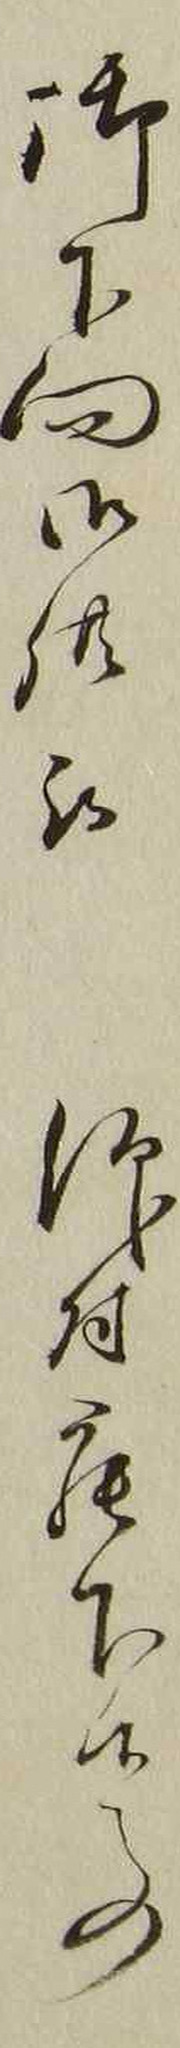御下向御供被仰付罷下候事
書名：諸士系譜　巻之8　い之部8
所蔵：会津若松市立会津図書館
